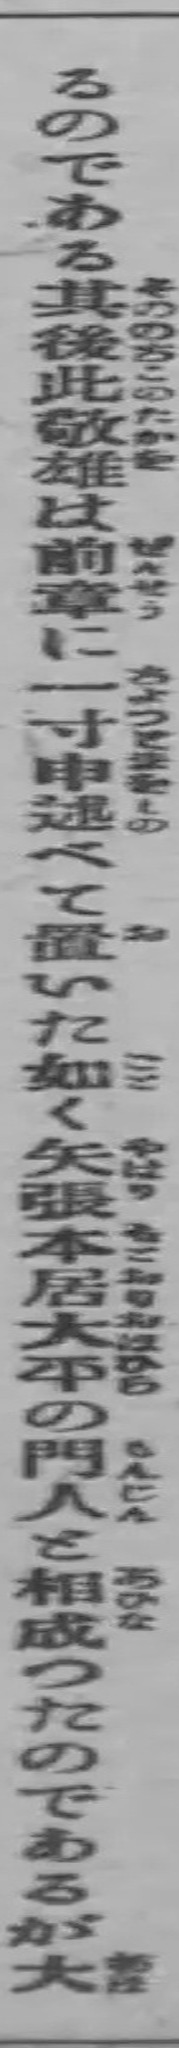るのである其後此敬雄は前章に一寸申述べて置いた如く矢張本居大平の門人と相成つたのであるが大
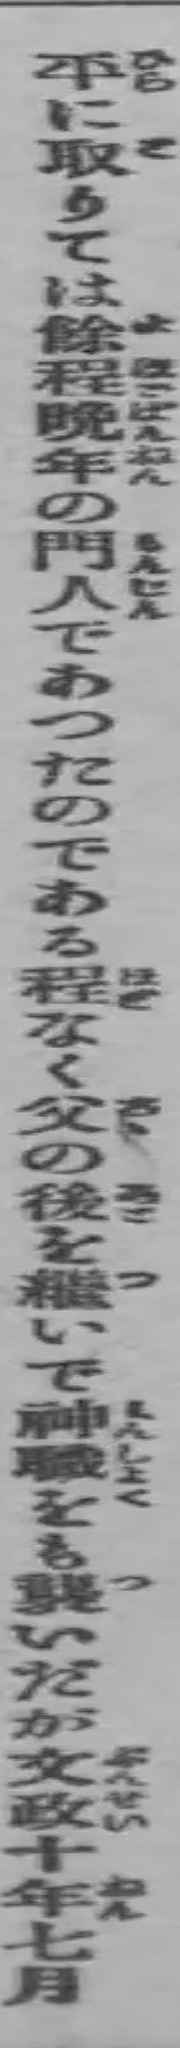平に取りては余程晩年の門人であつたのである程なく父の後を継いで神職をも襲いだが文政十年七月
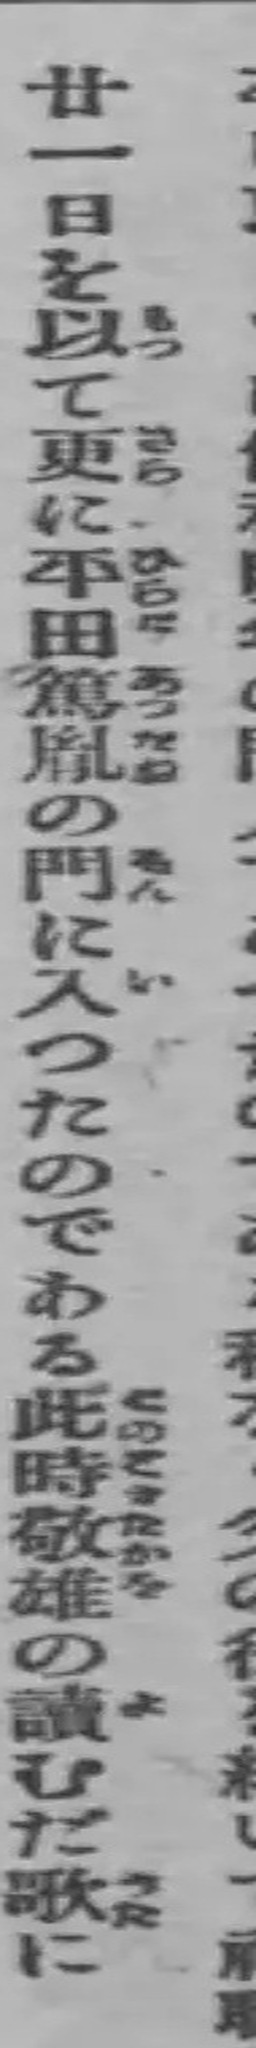廿一日を以て更に平田篤胤の門に入つたのである此時敬雄の読むだ歌に
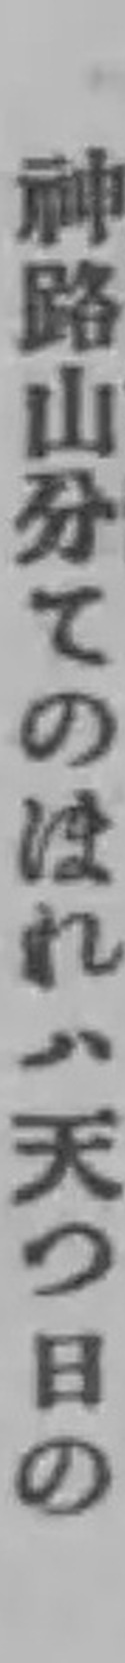神路山分てのほれは天つ日の
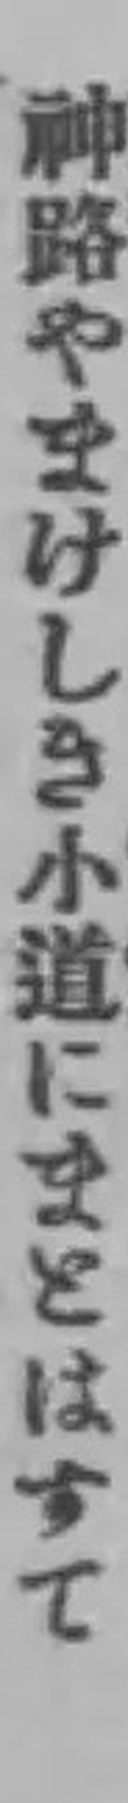神路やまけしき小道にまとはすて
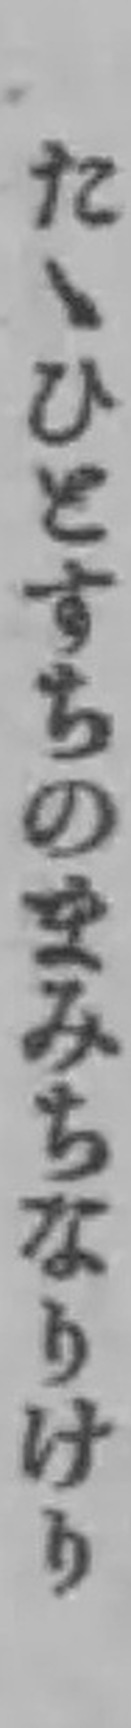たゝひとすちのまみちなりけり
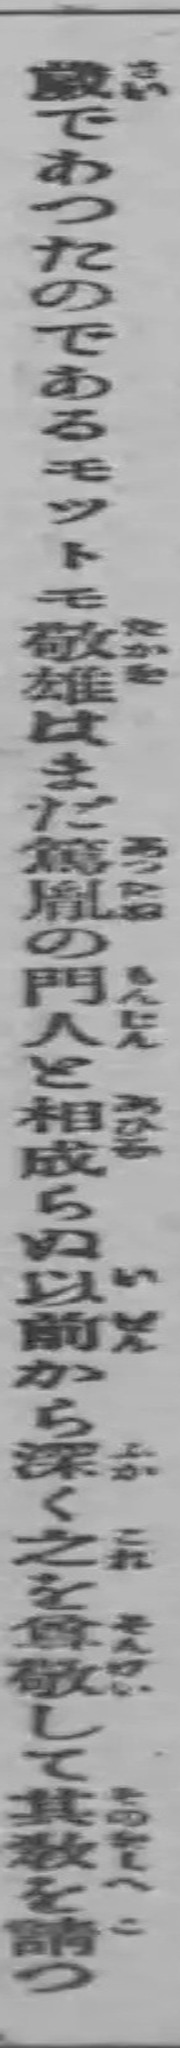歳であつたのであるモツトモ敬雄はまだ篤胤の門人と相成らぬ以前から深く之を尊敬して其教を請つ
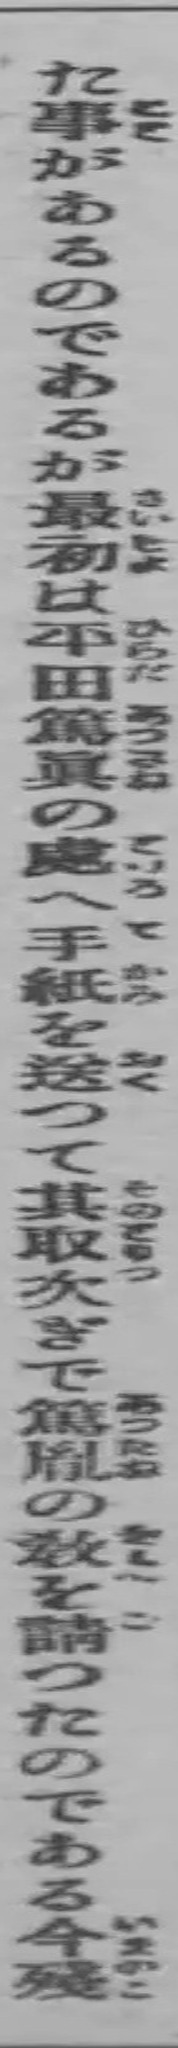た事があるのであるが最初は平田篤胤の処へ手紙を送つて其取次ぎで篤胤の教を請つたのである今残
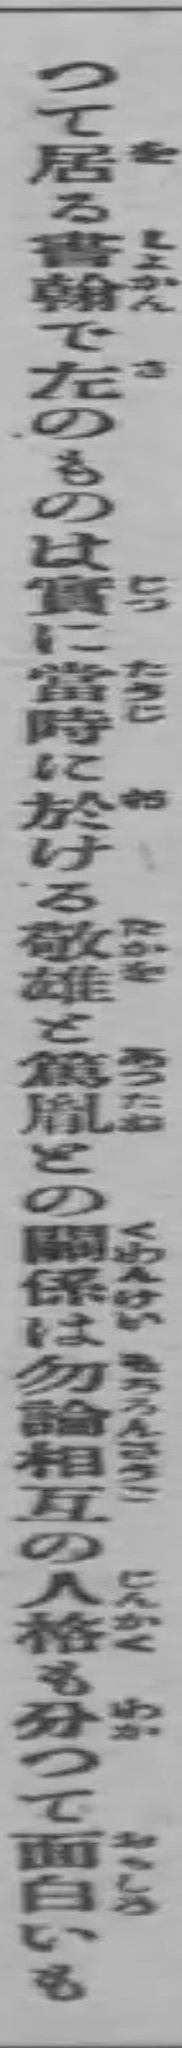つて居る書翰で左のものは実に当時に於ける敬雄と篤胤との関係は勿論相互の人格も分つて面白いも
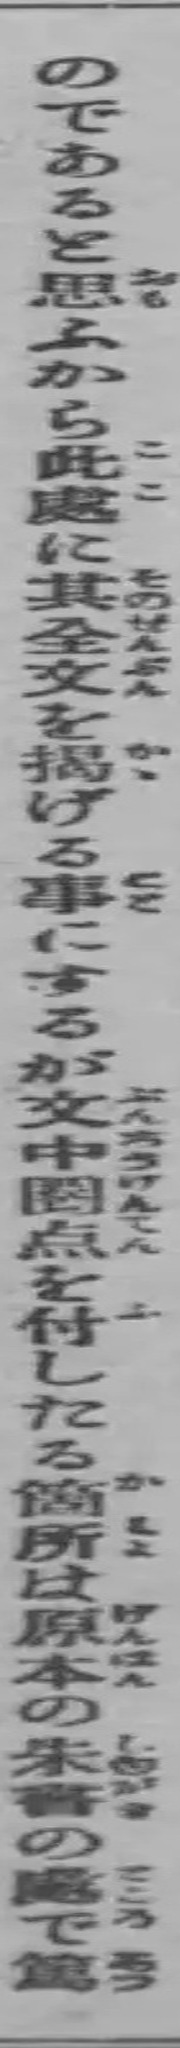のであると思ふから此処に其全文を掲げる事にするが文中圏点を付したる箇所は原本の朱書の処で篤
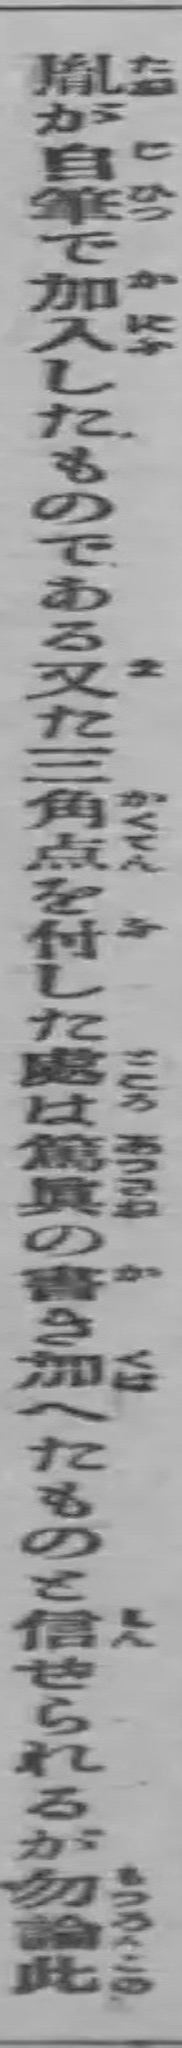胤が自筆で加入したものである又た三角点を付した処は篤胤の書き加へたものと信ぜられるが勿論此
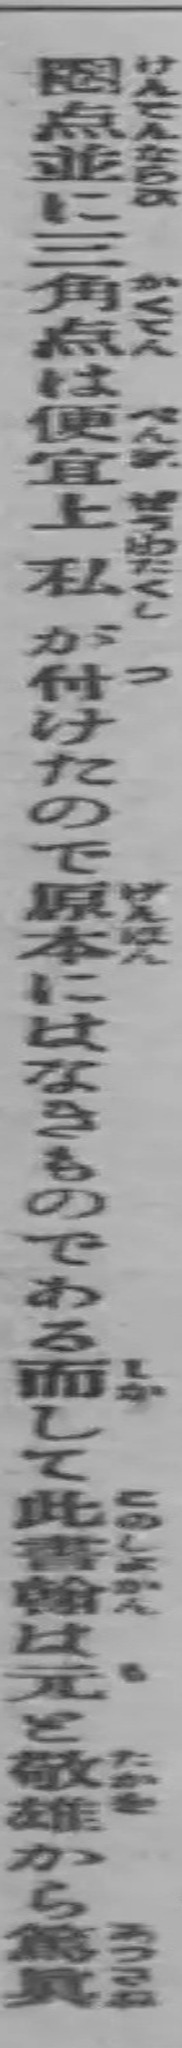圏点並に三角点は便宜上私が付けたので原本にはなきものである而して此書翰は元と敬雄から篤胤

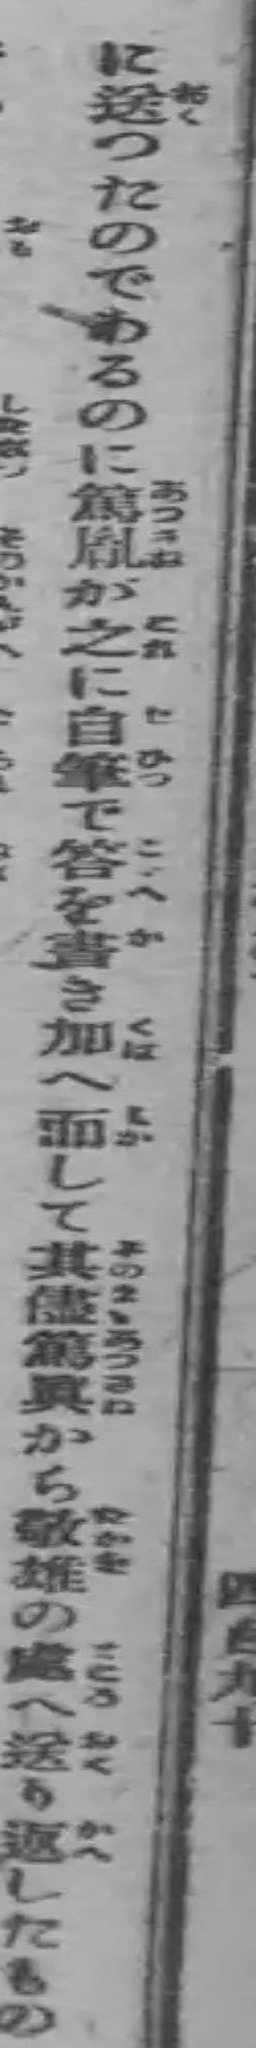に送つたのであるのに篤胤が之に自筆で答を書き加へ而して其侭篤実から敬雄の処へ送り返したもの
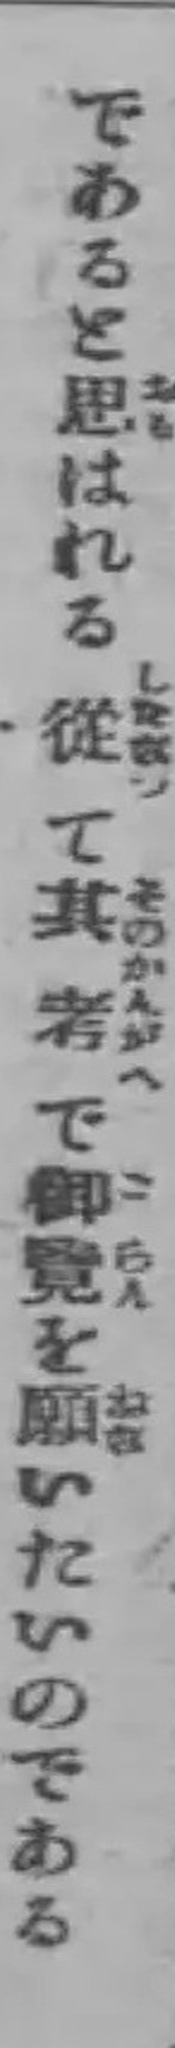であると思はれる従て其考で御覧を願いたいのである
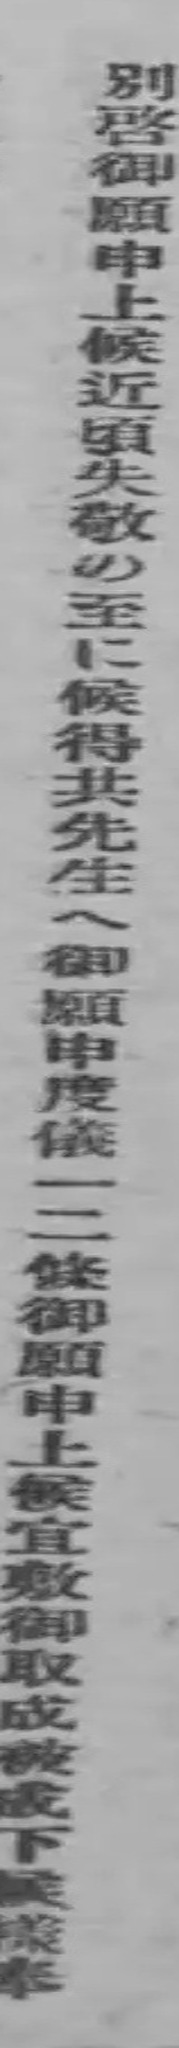別啓御願申上候近頃失敬の至に候得共先生へ御願申度儀一二條御願申上候宜敷御取成被下候様奉
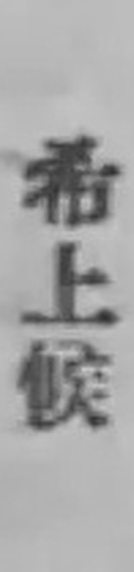希上候
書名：豊橋市史談
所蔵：国立国会図書館 National Diet Library, JAPAN
